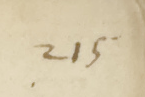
215
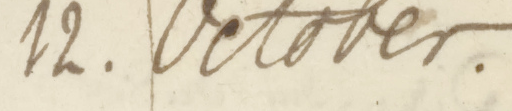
12. October.
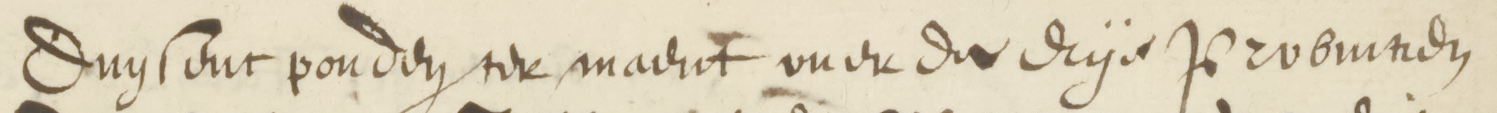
duysent ponden ter maent over de drije provintien
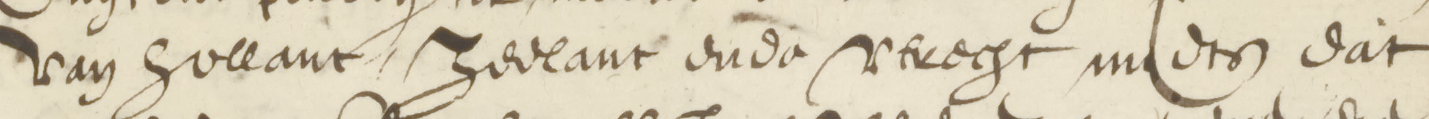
van Holland, Zeeland ende Utrecht midts dat
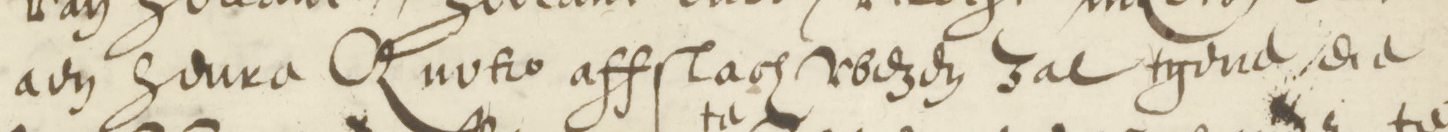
aen heure Quote affslach wezen zal tgene die
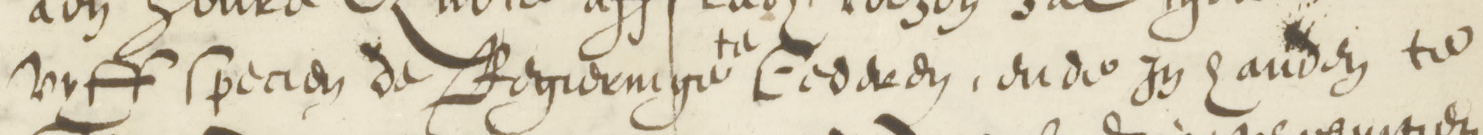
vyff specien de Regieringete Cederen, ende In handen te
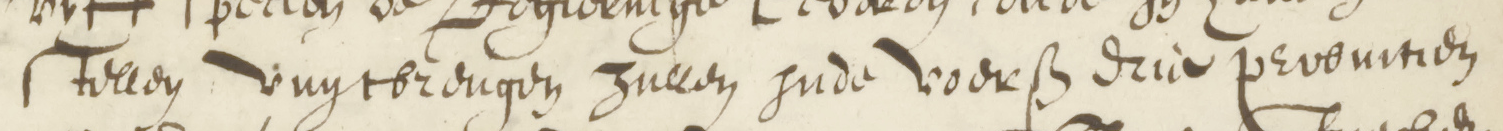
stellen vuytbrengen zullen Inde voers drie provintien
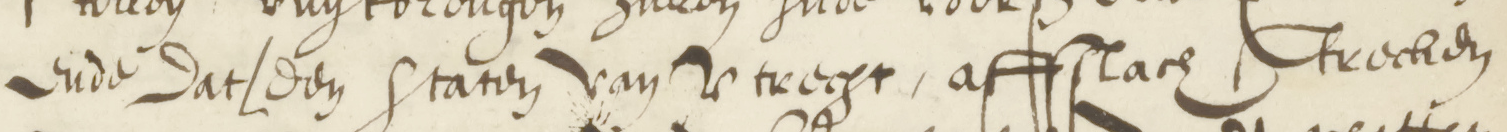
ende dat/den staten van Utrecht, affslach strecken
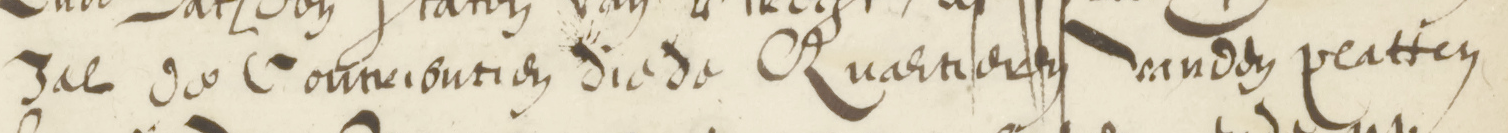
zal de contributien die de Quartieren vanden platten
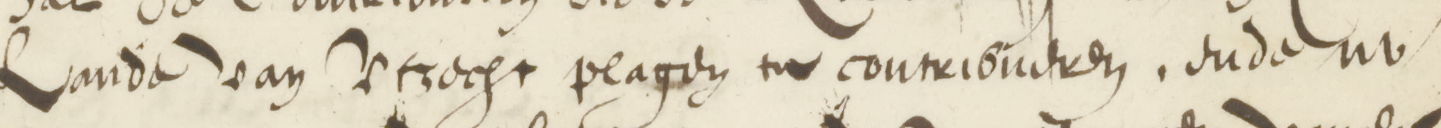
Lande van Utrecht plagen te contribueren, ende nu
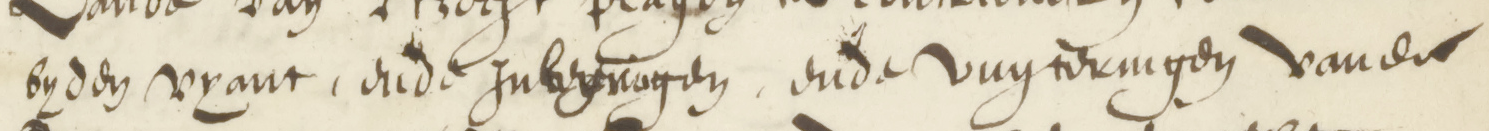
by den vyant, ende inlegnogen ende vuyteringen vande
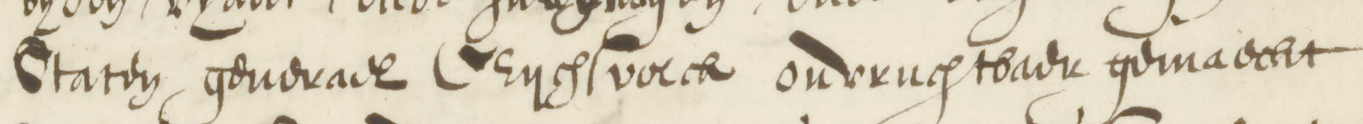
Staten Generael Cruychsvolck onvruchtbaer gemaeckt
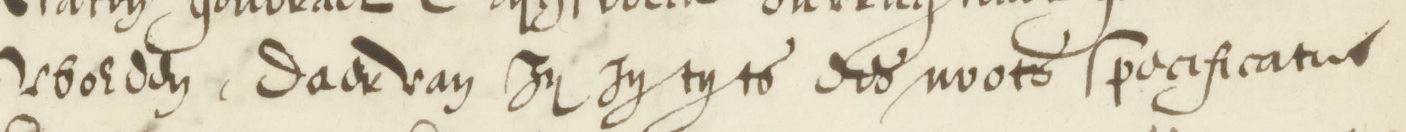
worden daervan zy Intijts des noots specificatie
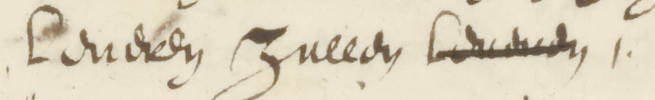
leueren zullen leueren.
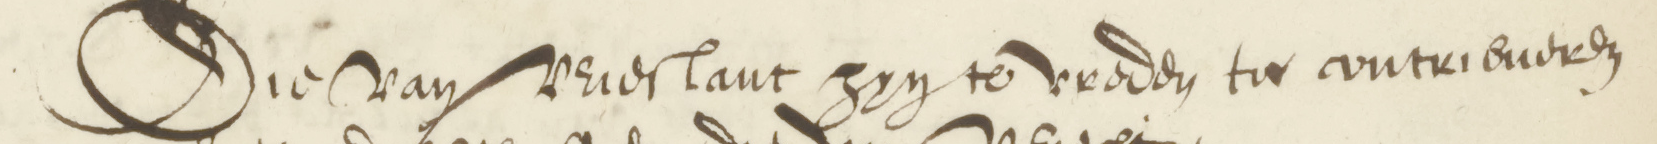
Die van Vrieslant zyn te vreden te contribueren
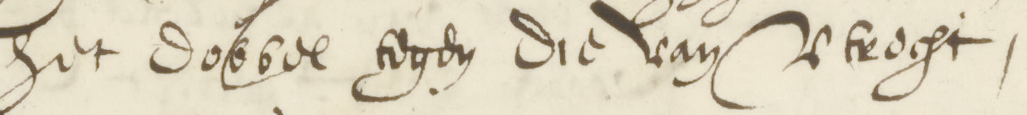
het dobbel tegen die van Utrecht.
